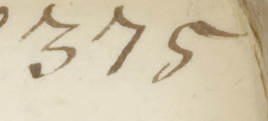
375
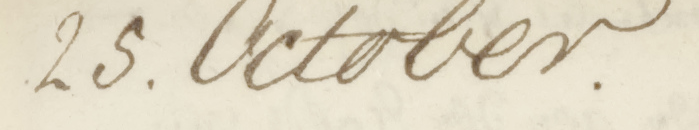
25. October.
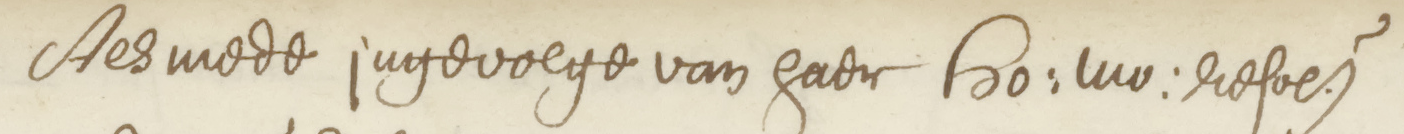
Alsmede ingevolge van haer Ho:mo: resol
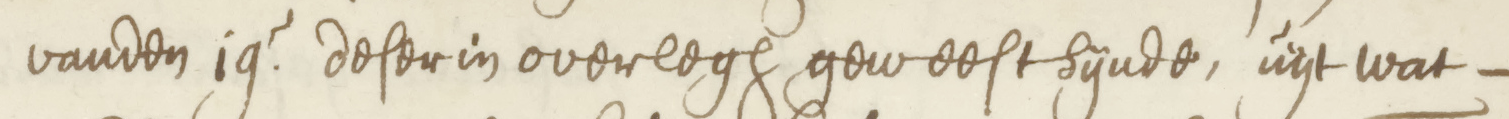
vanden 19e. deser in overlegh geweest sijnde, uijt wat
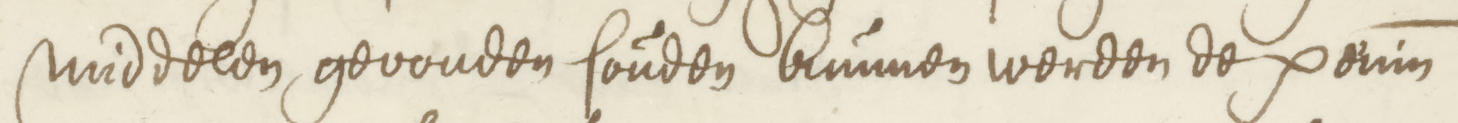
middelen, gevonden souden kunnen werden de penin
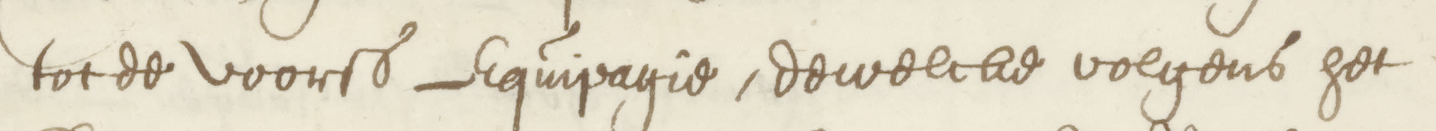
tot de voors Equipagie, dewelcke volgens het
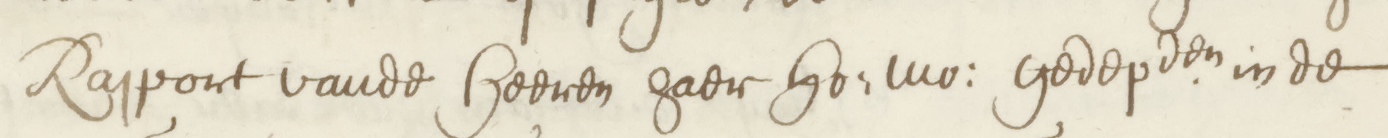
Rapport vande heeren haer ho:mo: gedepden. in de
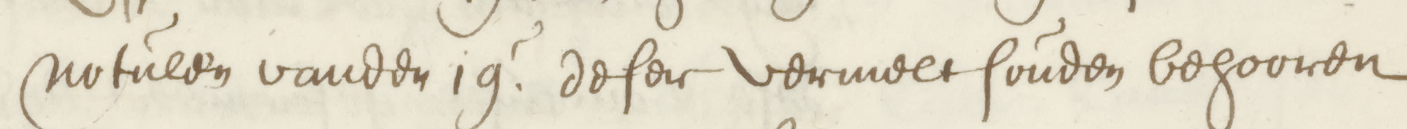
notulen vanden 19e. deser vermelt souden behooren
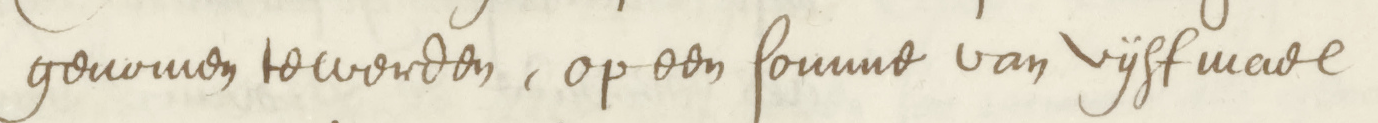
genomen te werden, op een somme van vijffmael
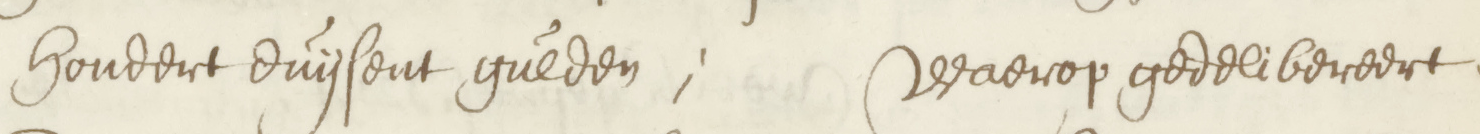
hondert duijsent gulden; Waerop gedelibereert
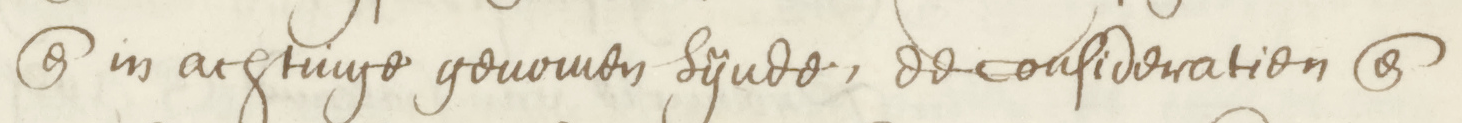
& in achtinge genomen sijnde, de consideratien &
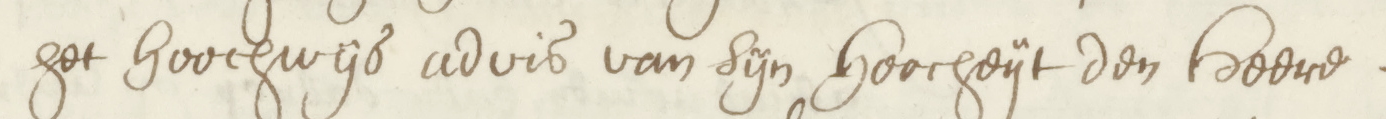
het hoochwijs advis van sijn hoocheijt den heere
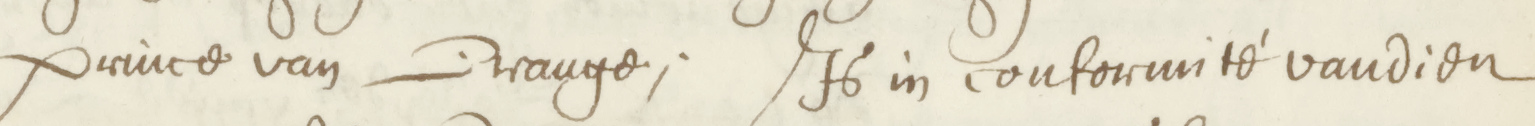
Prince van Orange; Is in conformité vandien
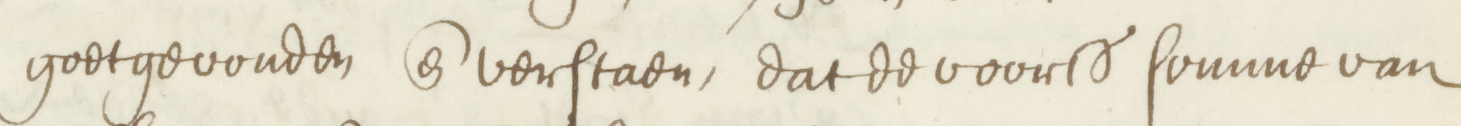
goetgevonden & verstaen, dat de voors somme van
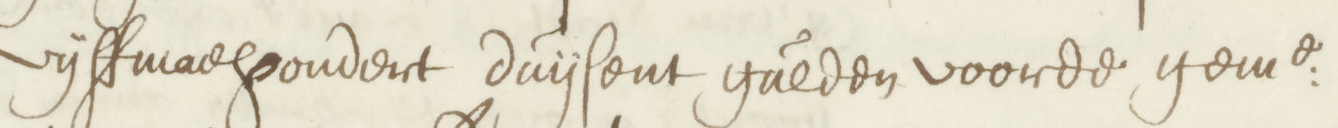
vijffmael hondert duijsent gulden voorde geme:
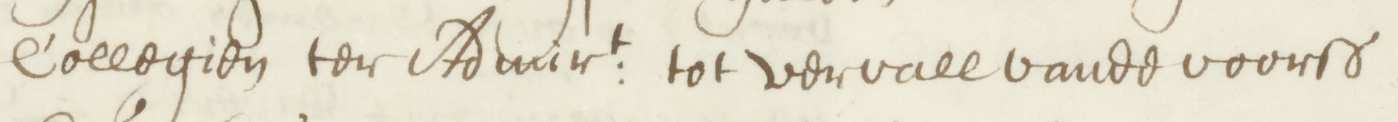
Collegien ter Admirt: tot vervall vande voors
